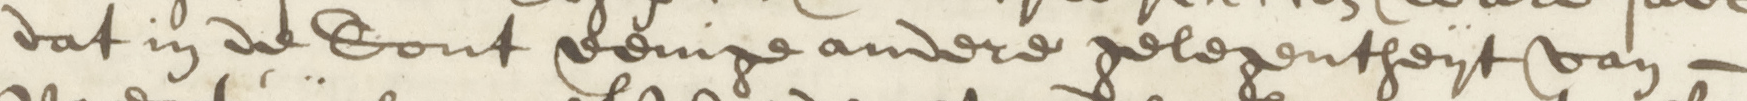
dat in de Sont eenige andere gelegentheijt van —
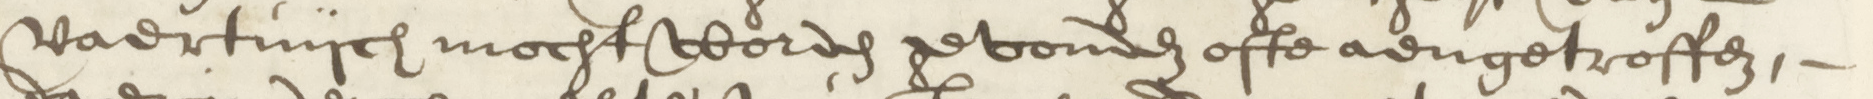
Vaertuijch mocht worden gevonden ofte aengetroffen, —
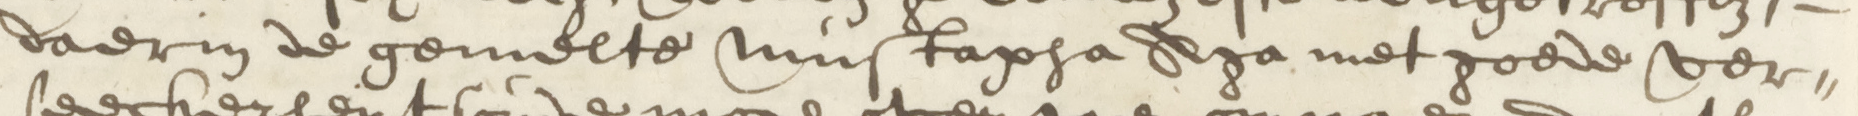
daerin de gemelte Mustapfa Aga met goede ver„
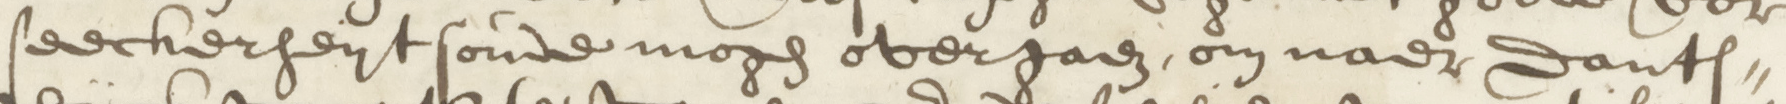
seeckerheijt soude mogen overgaen, om naer Dants„
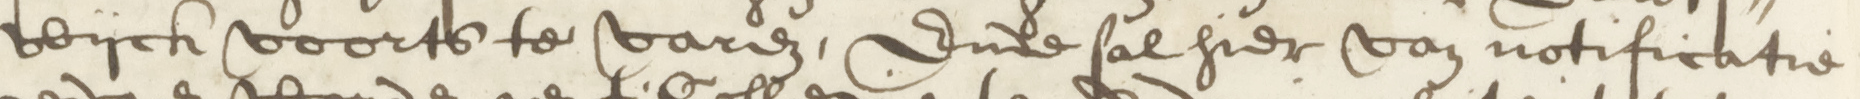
wijck voorts te varen. Ende sal hier van notificatie
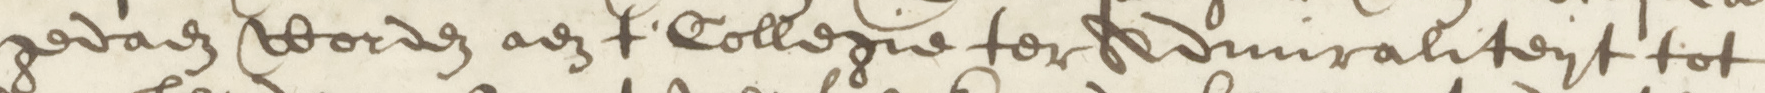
gedaen worden aen t‛ Collegie ter Admiraliteijt tot —
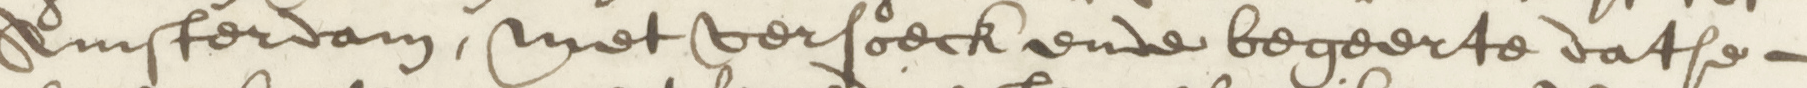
Amsterdam, met versoeck ende begeerte datse —
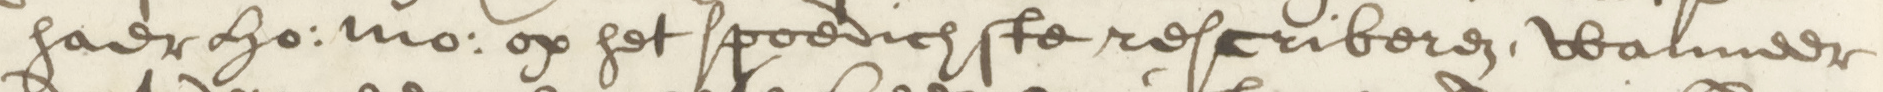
haer Ho:Mo: op het spoedichste rescriberen, wanneer
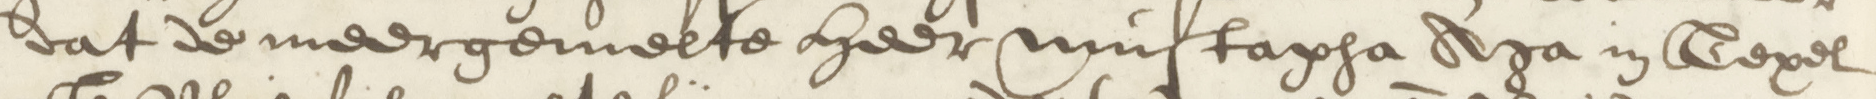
dat de meergemelte heer Mustapfa Aga in Texel
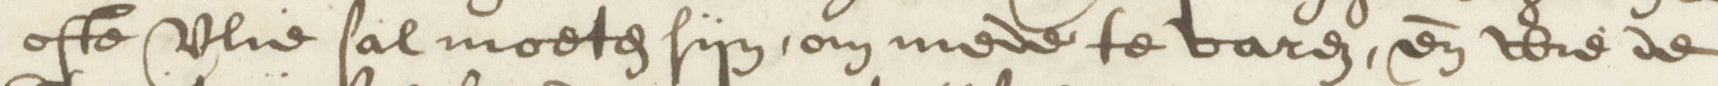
ofte Vlie sal moeten sijn, om mede te varen en wie de —
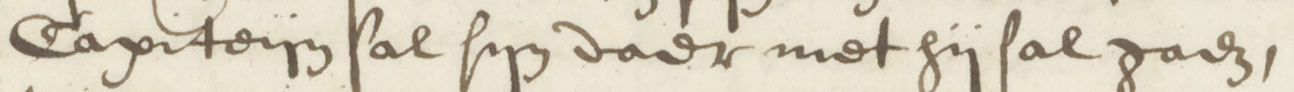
Capiteijn sal sijn daer met hij sal gaen.
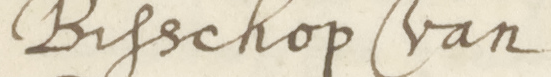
Bischop van
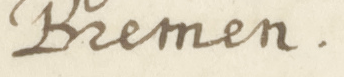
Bremen.
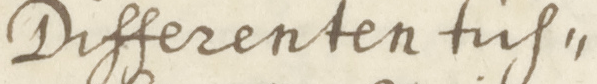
Differenten tus„
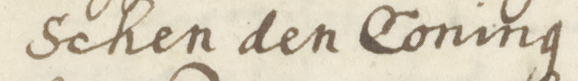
Schen den Coning
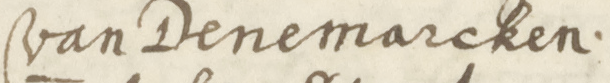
van Denemarcken
